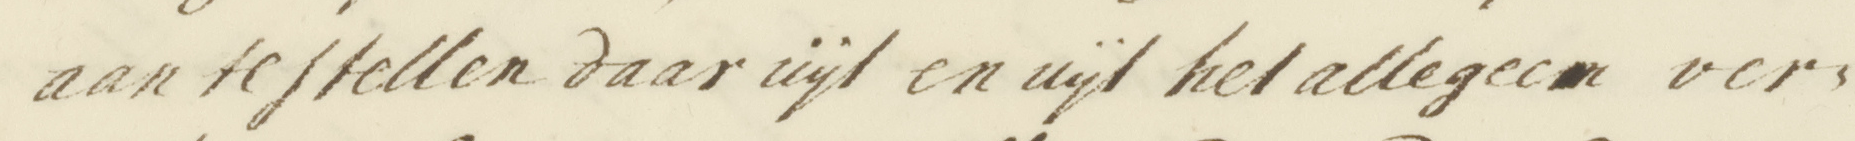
aan te stellen daar uijt en uijt het allegeen ver„
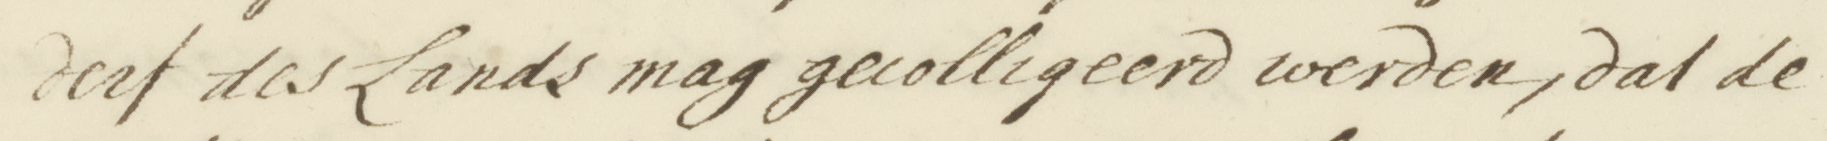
derf des Lands mag gecolligeerd werden, dat de
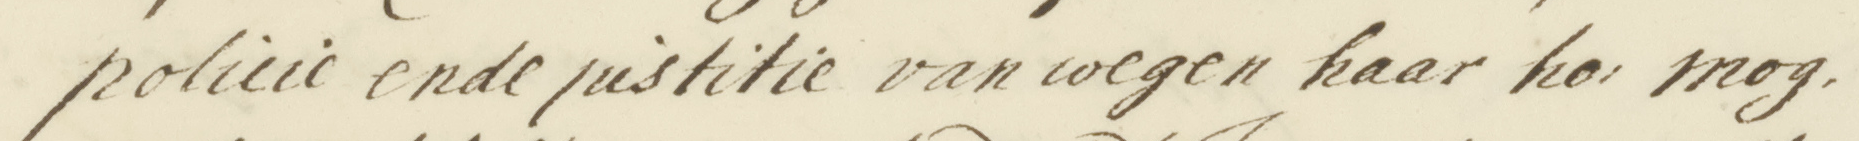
policie ende justitie van wegen haar ho:mog.
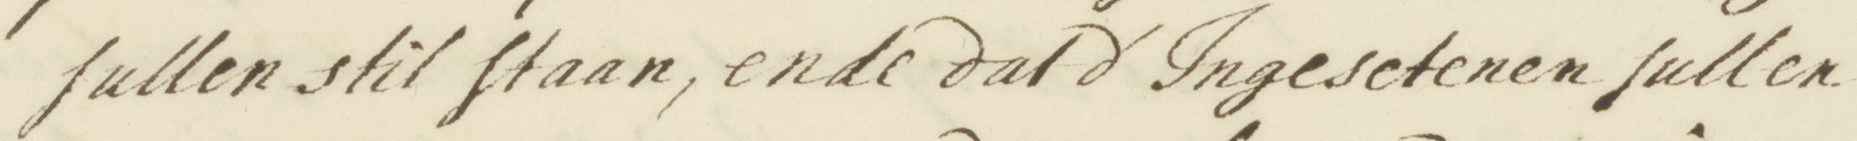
sullen stil staan, ende dat d’ Ingesetenen sullen
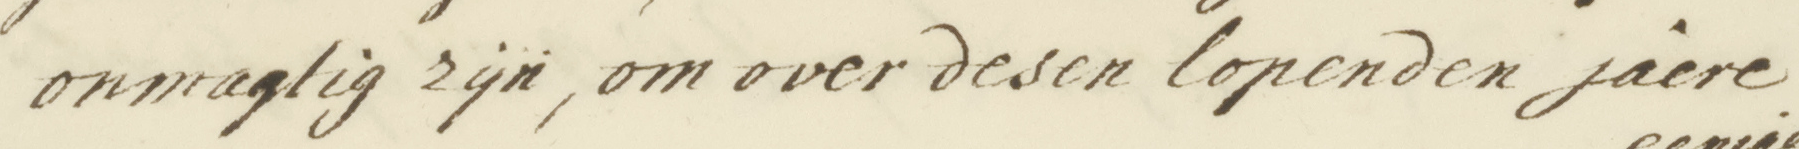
onmagtig zijn, om over desen lopenden jaere
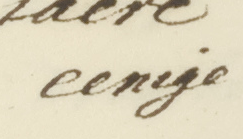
eenige
